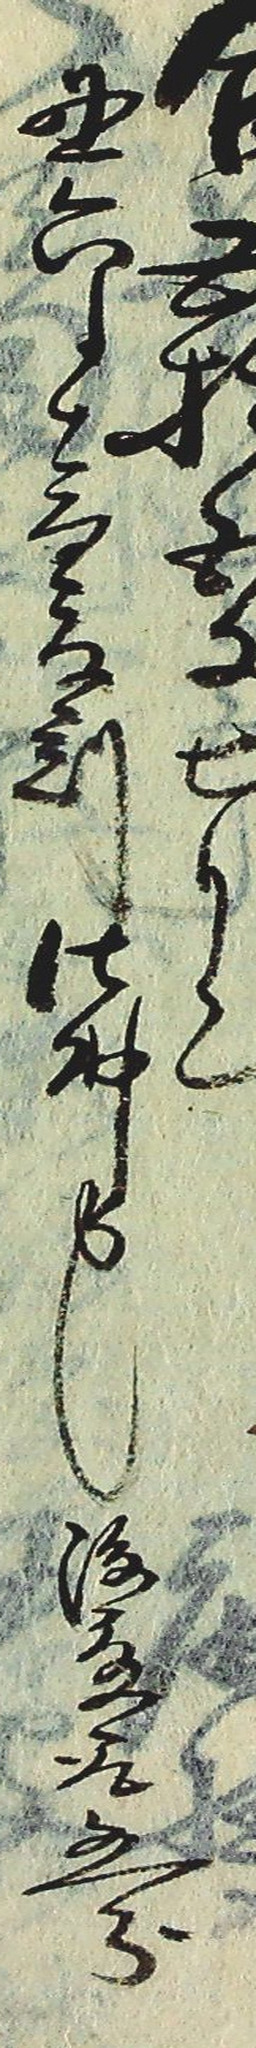丑六月十二日夏割仕払申候後藤取かへ分
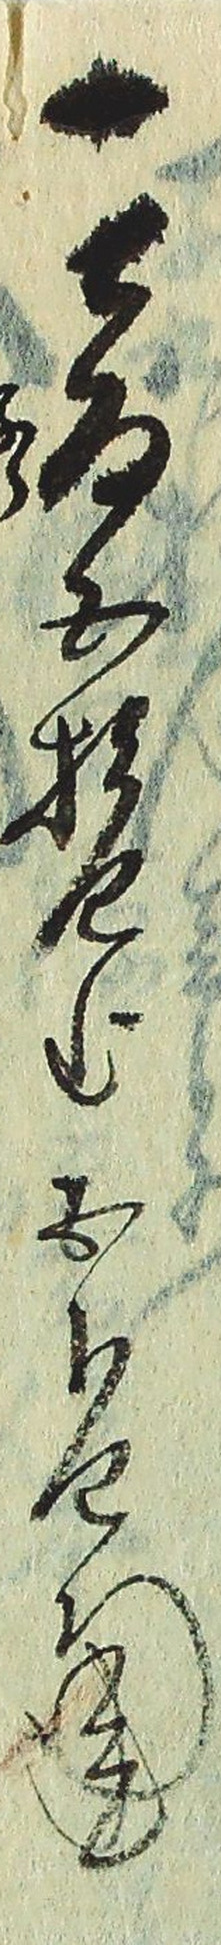一七百五拾四匁五分四厘
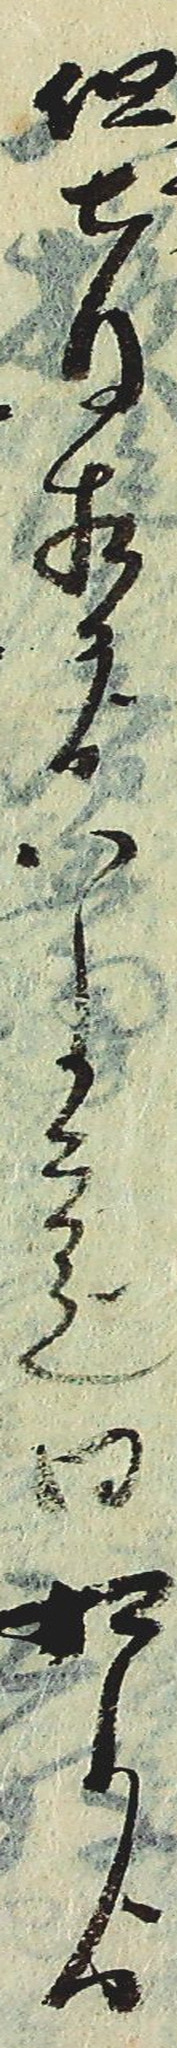但子七月十九日ゟ八月二日迄同九日ゟ
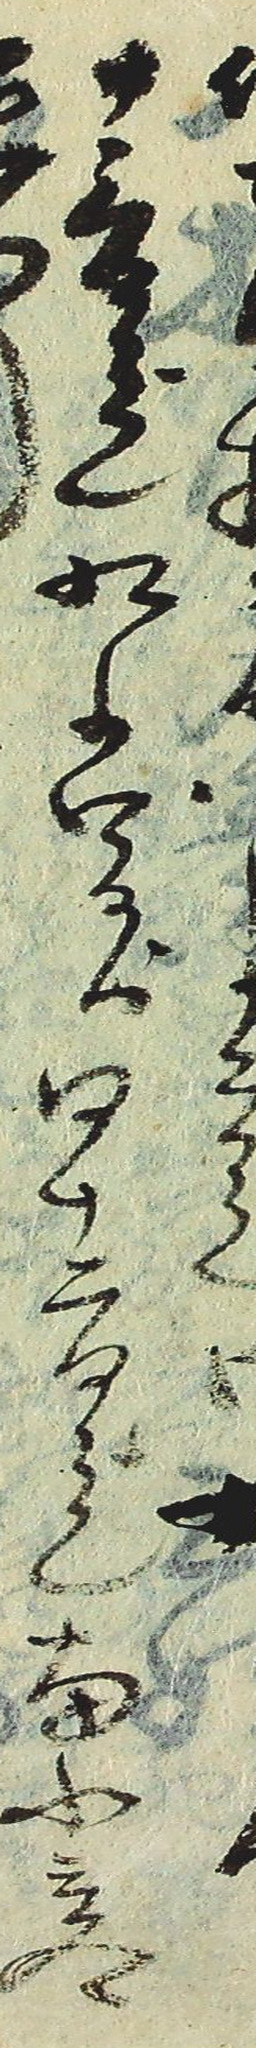十三日迄九月四日ゟ同十二日迄南北立合
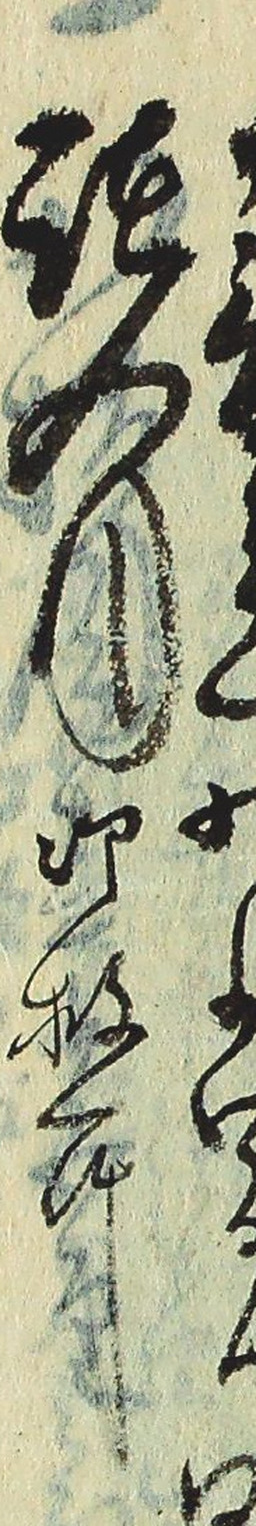諸入用御救一件
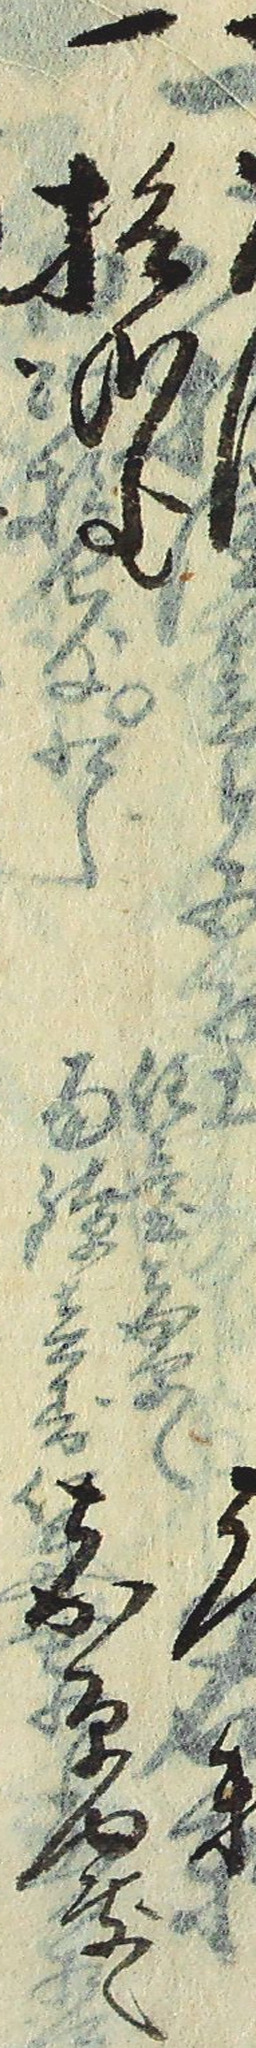一拾弐匁嘉兵衛内処へ

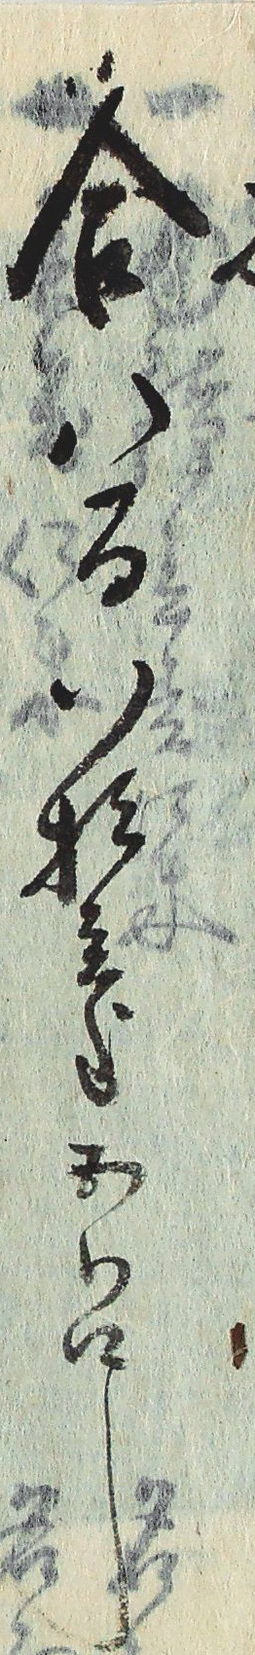合八百八拾壱匁五分四厘
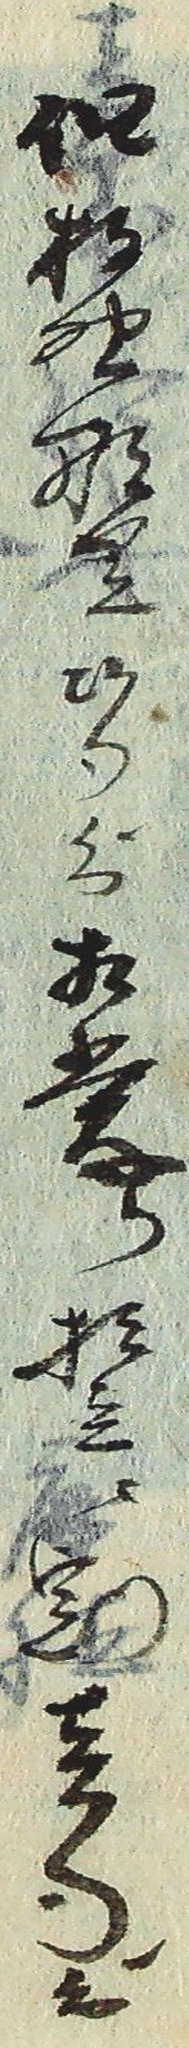但板野那賀弐つ分相当り拾壱に割壱つ分
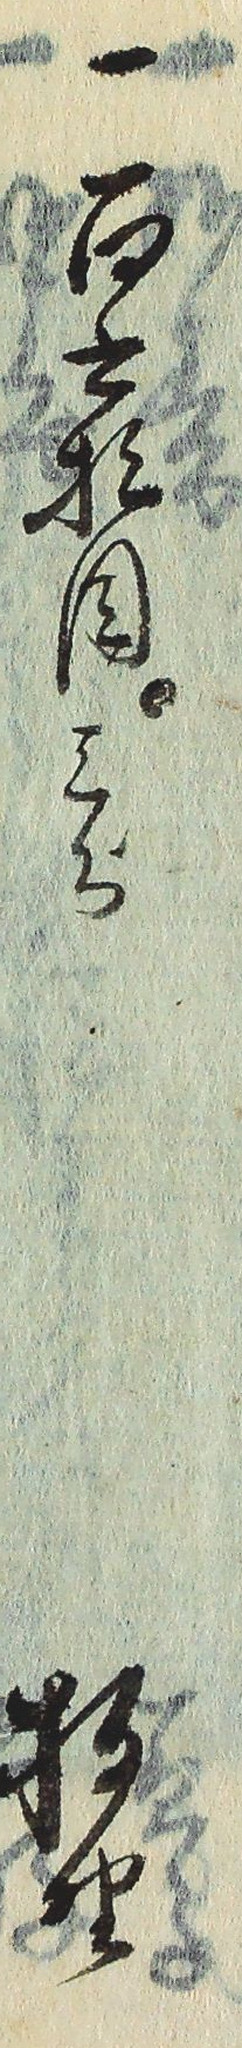一百六拾目三分板野
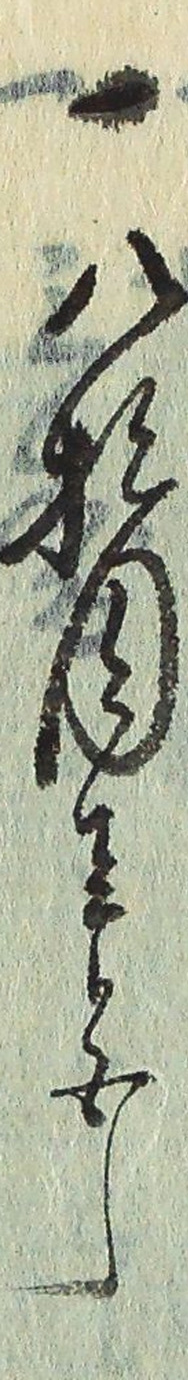八拾目壱分五厘
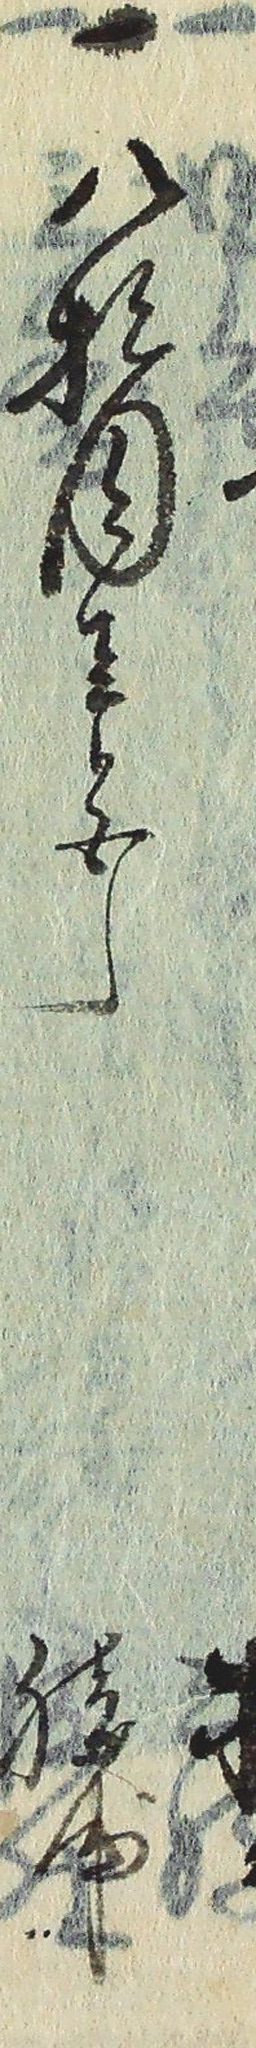一八拾目壱分五厘勝浦
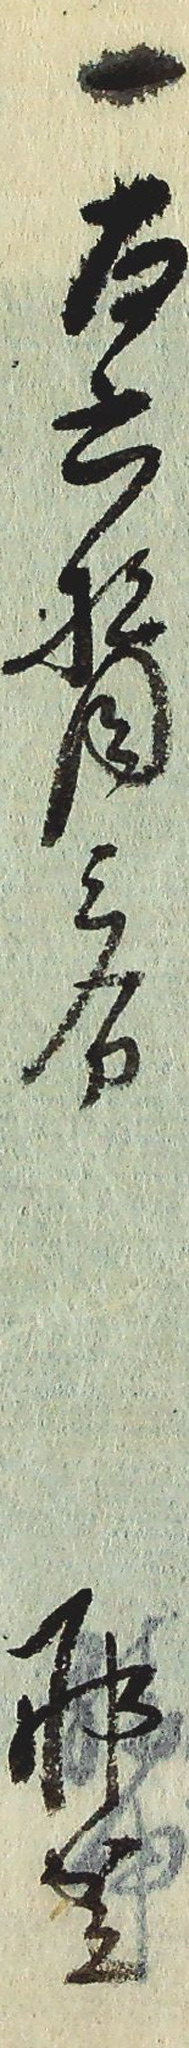一百六拾目三分板野
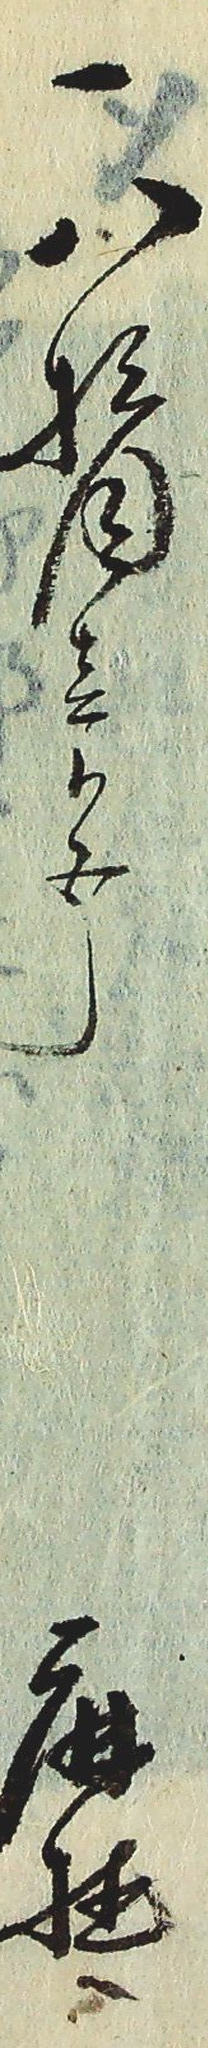一八拾目壱分五厘麻植
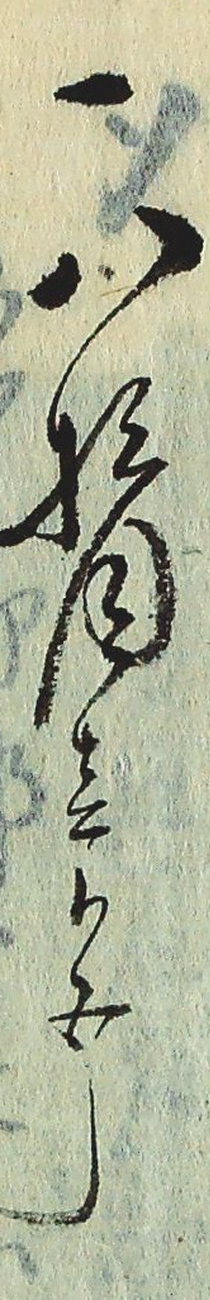八拾目壱分五厘
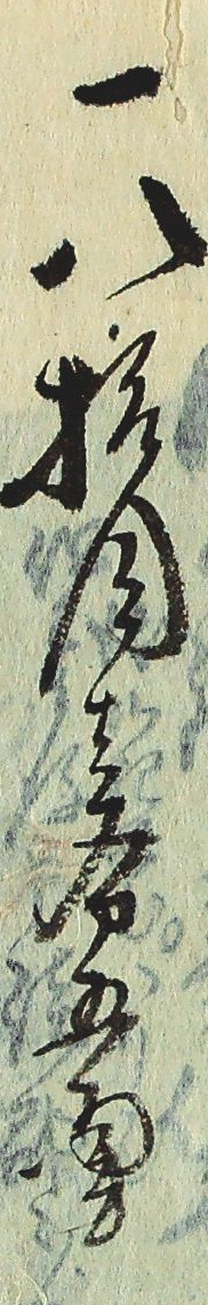八拾目壱分五厘
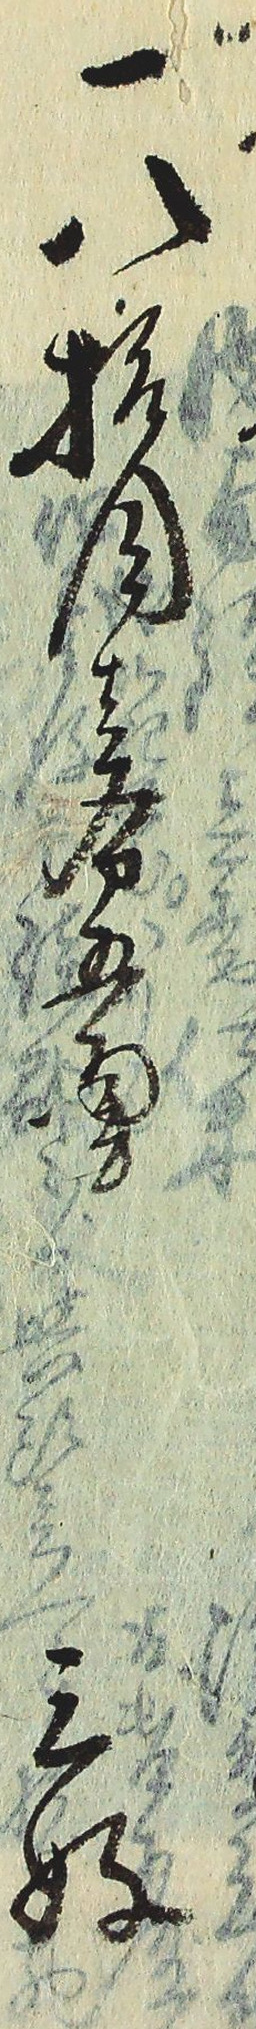一八拾目壱分五厘三好
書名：名東郡中諸割賦元帳
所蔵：鳴門教育大学 Naruto University of Education
